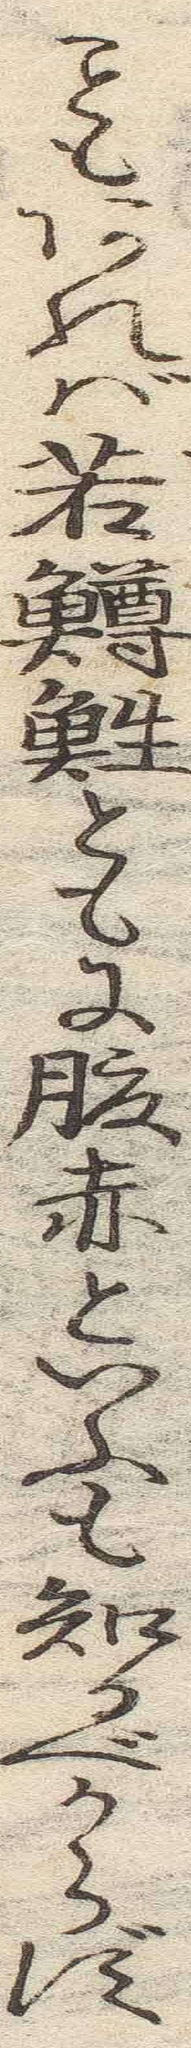こともあれば若鱒鮭ともに腹赤といふも知るべからず
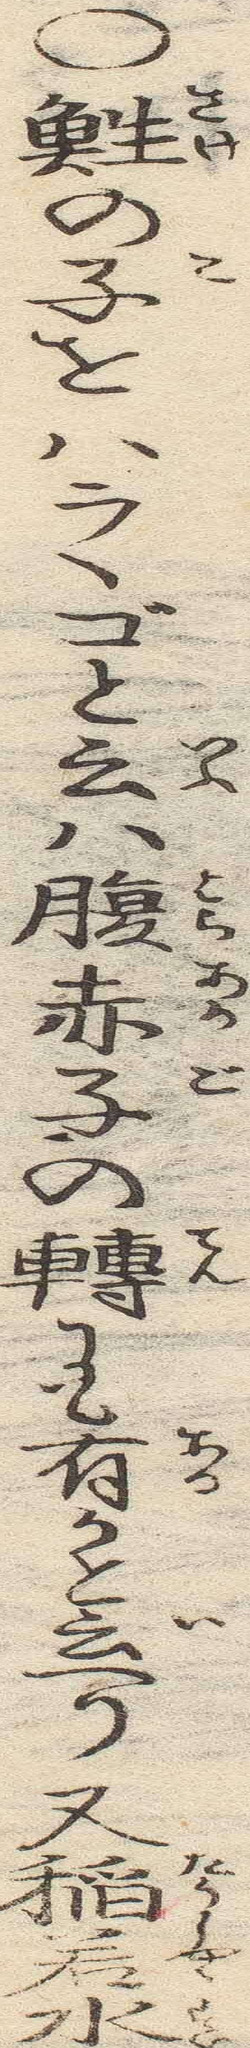○鮭の子をハラヽゴと云は腹赤子の転にも有かと云へり又稲若水
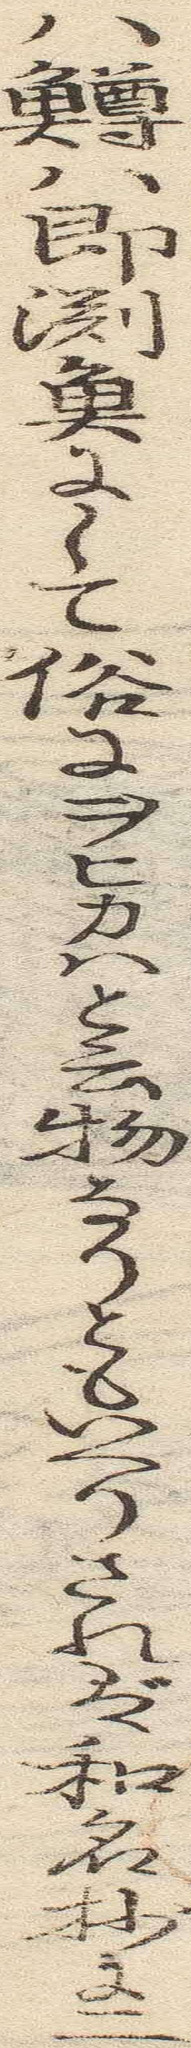は鱒は即渕魚にして俗にヲヒカハと云物なりともいへりされば和名抄に二
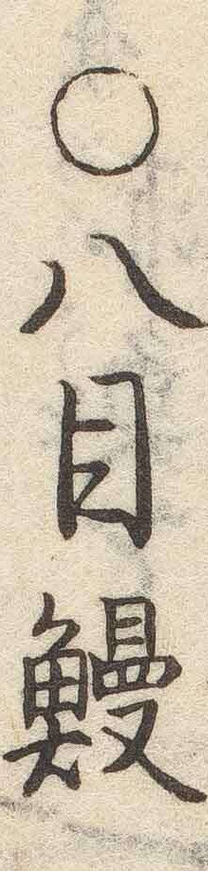○八目鰻
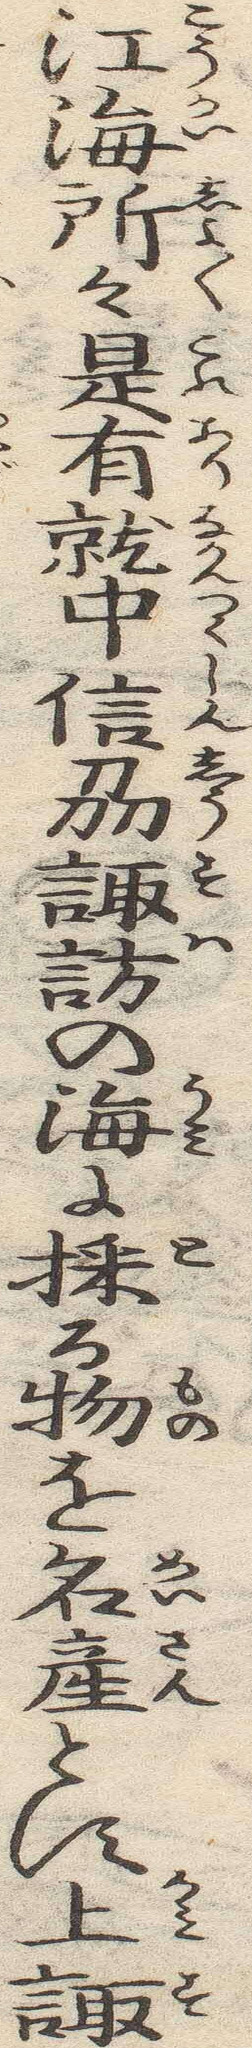江海所々是有就中信州諏訪の海に採る物を名産とす上諏
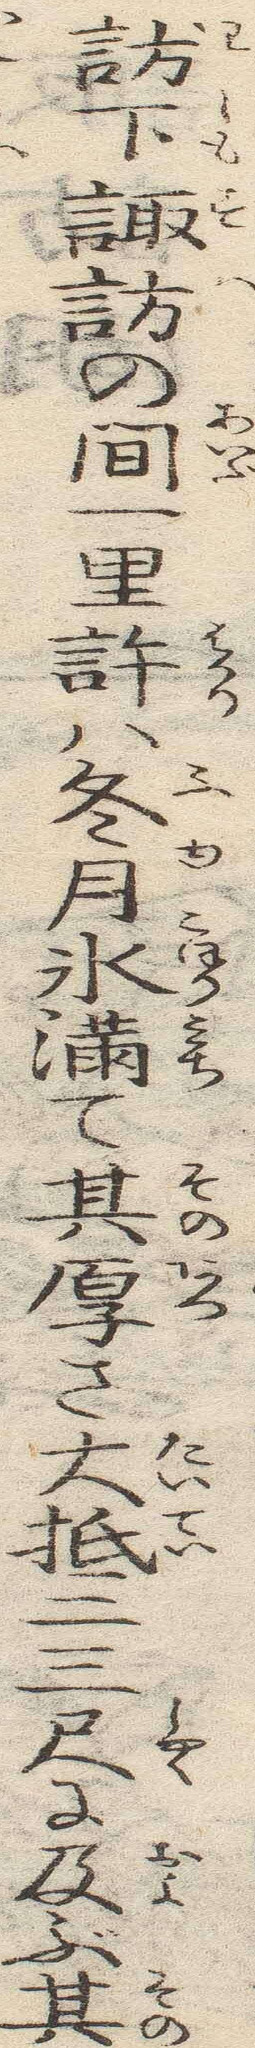訪下諏訪の間一里許は冬月氷満て其厚さ大抵二三尺に及ぶ其
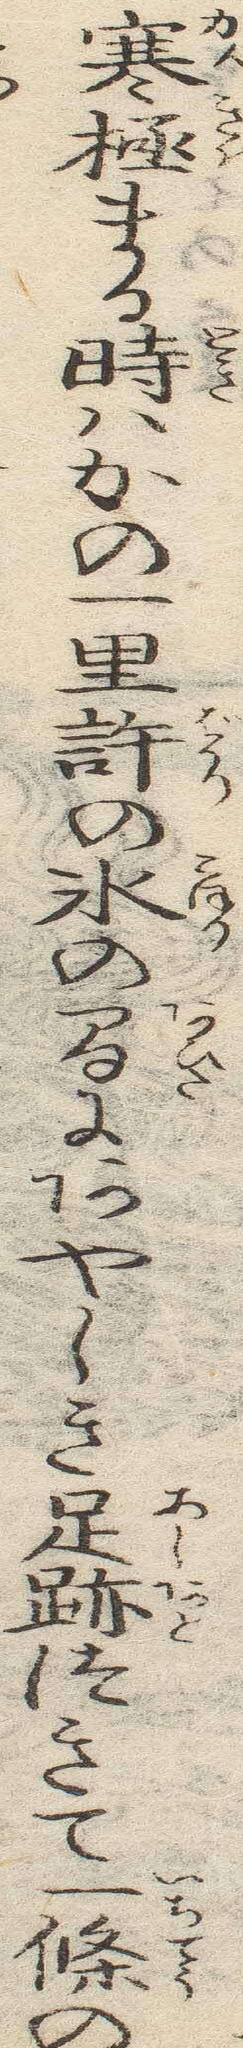寒極まる時はかの一里許の氷の間にあやしき足跡つきて一條の
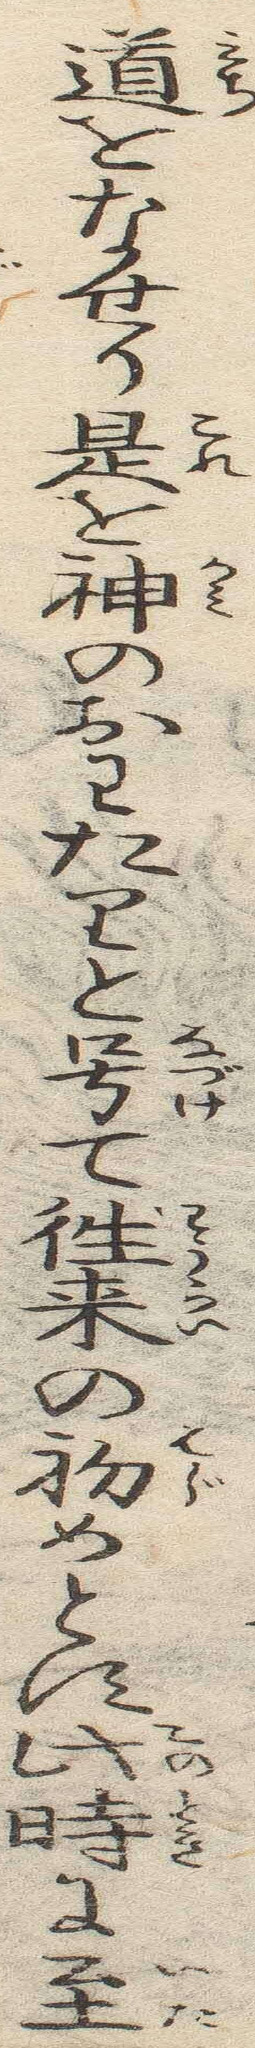道をなせり是を神のおわたりと号て往来の初めとす此時に至
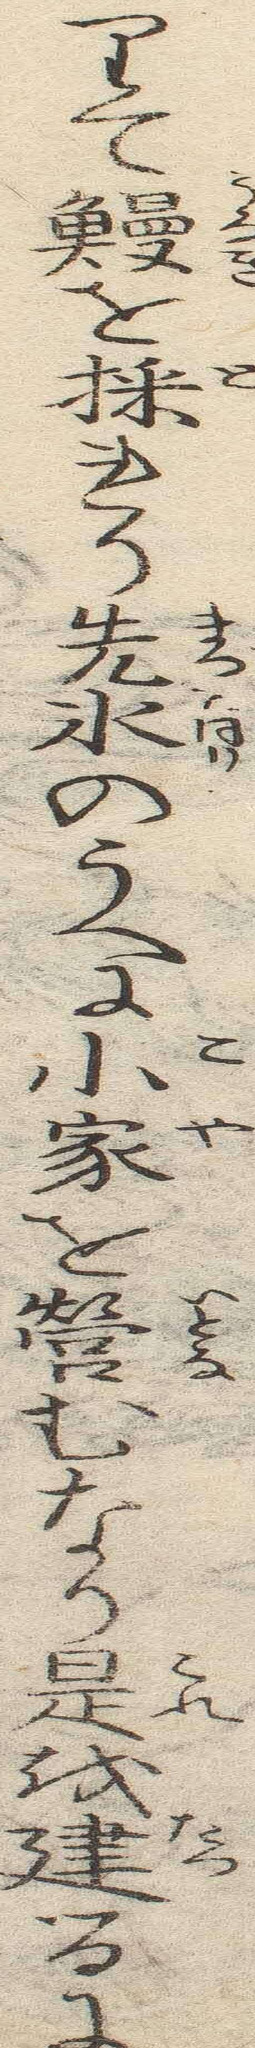りて鰻を採れり先氷のうへに小家を営むなり是を建るに
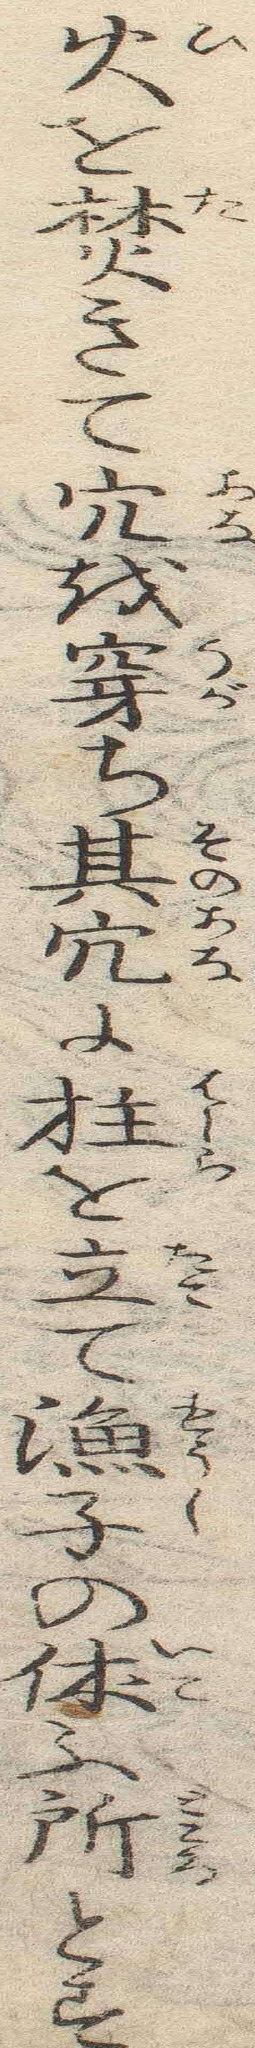火を焚きて穴を穿ち其穴に柱を立て漁子の休ふ所とす
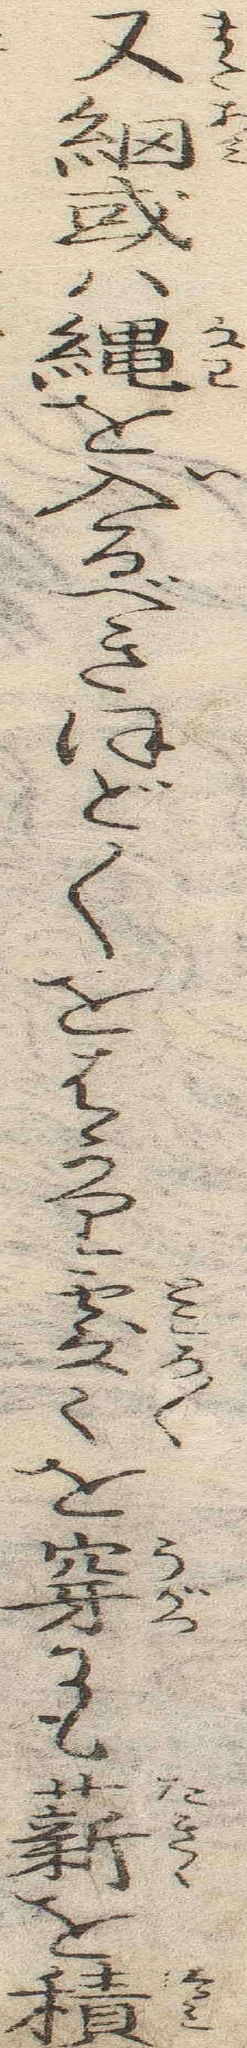又網或は縄を入るべきほど〳〵をはかり処々を穿にも薪を積
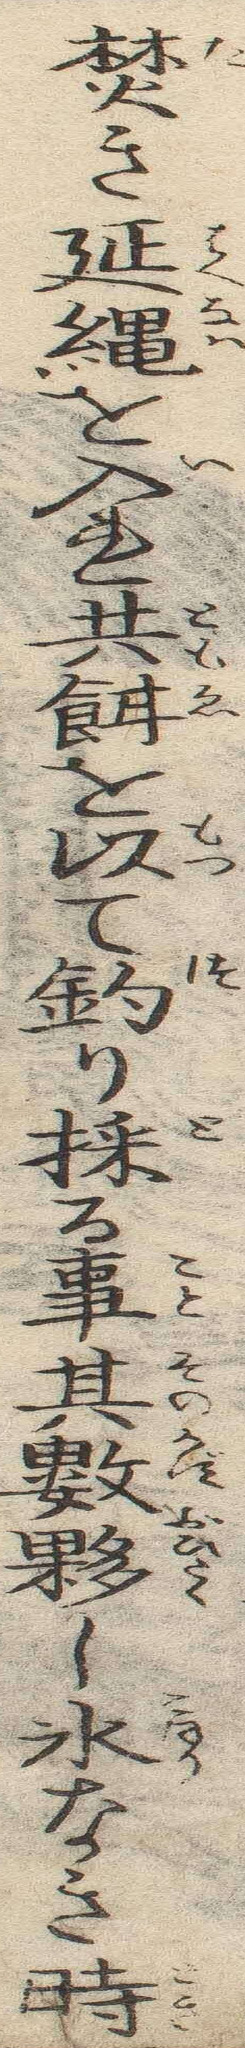焚き延縄を入れ共餌を以て釣り採る事其数夥し氷なき時
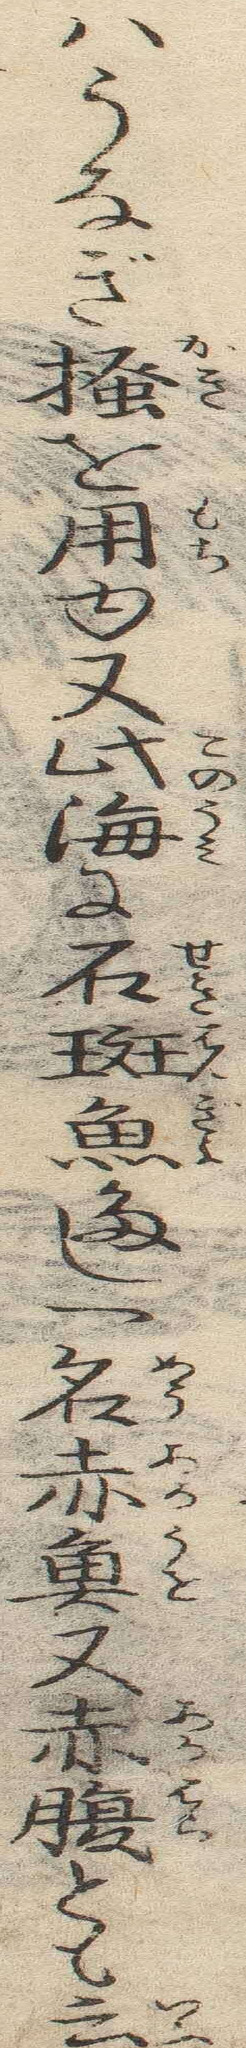はうなぎ掻を用ゆ又此海に石斑魚多し一名赤魚又赤腹とも云
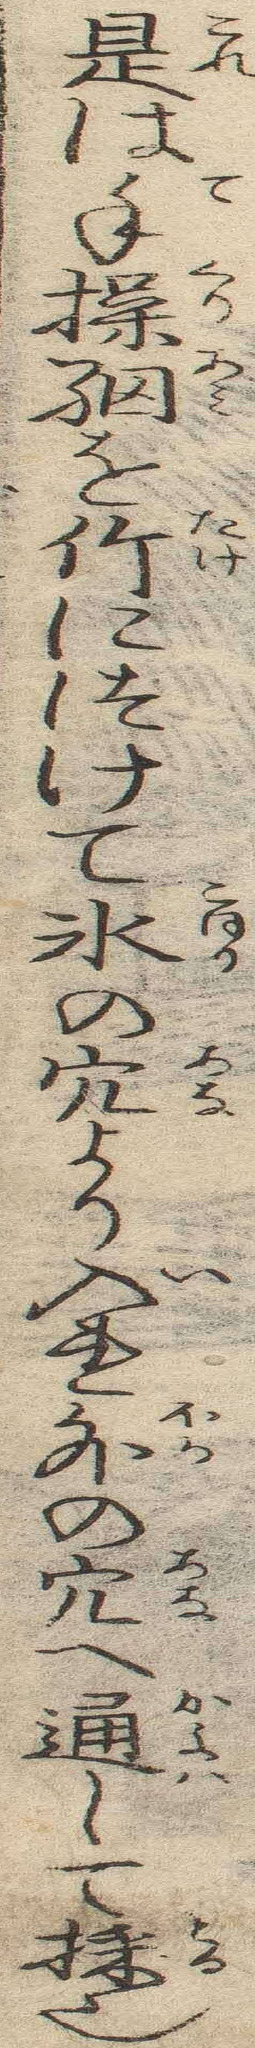是は手繰網を竹につけて氷の穴より入れ外の穴へ通して採也

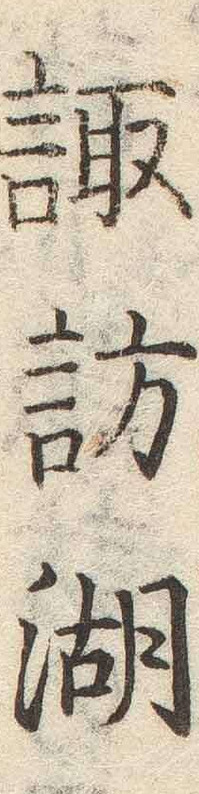諏訪湖
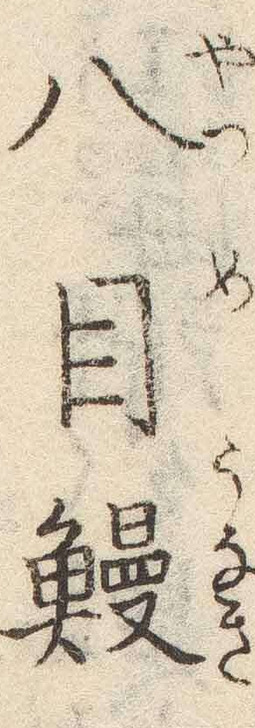八目鰻
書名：日本山海名産図会
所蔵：東京学芸大学附属図書館 国文学研究資料館
